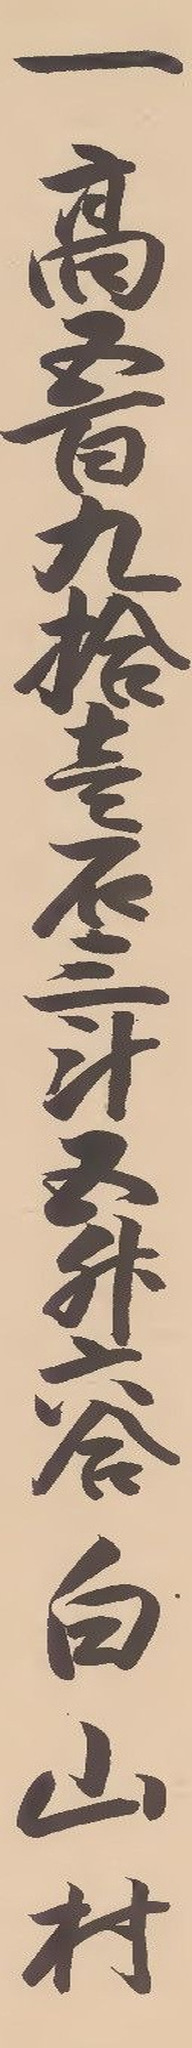一高五百九拾壱石三斗五升六合白山村
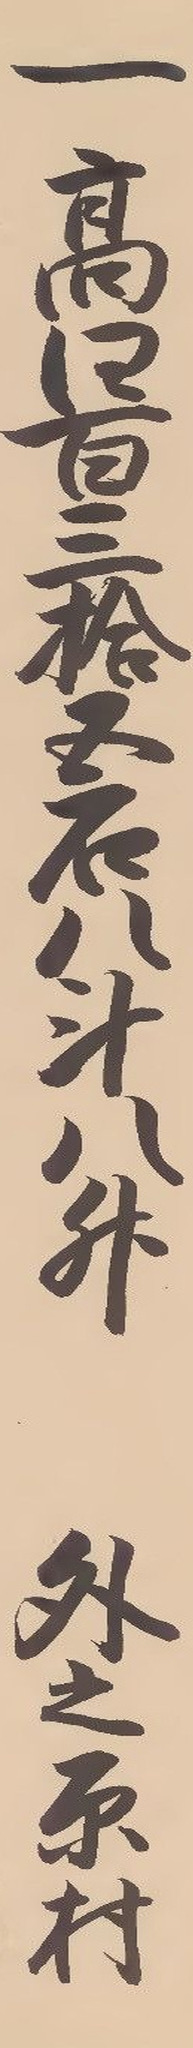一高四百三拾五石八斗八升外之原村
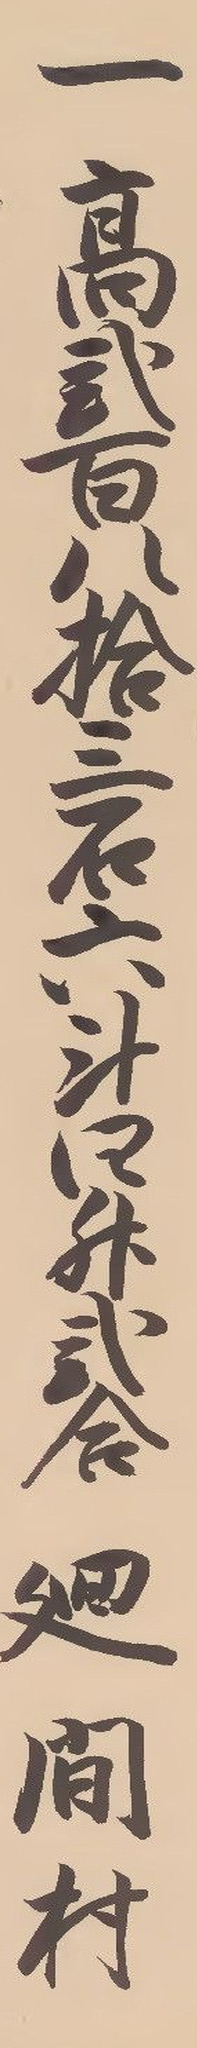一高弐百八拾三石六斗四升弐合廻間村
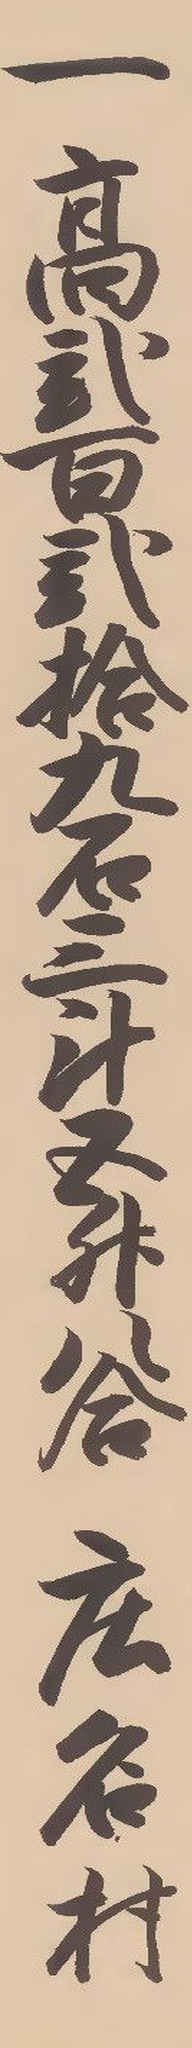一高弐百弐拾九石三斗五升八合庄名村
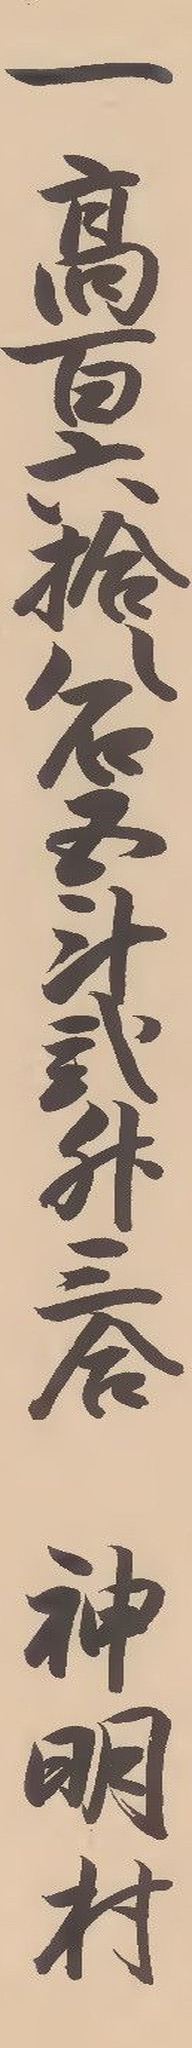一高百六拾八石五斗弐升三合神明村
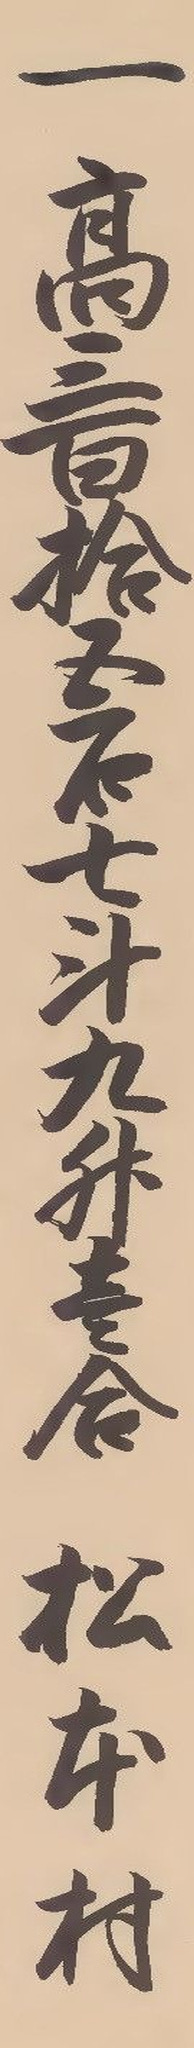一高三百拾五石七斗九升壱合松本村
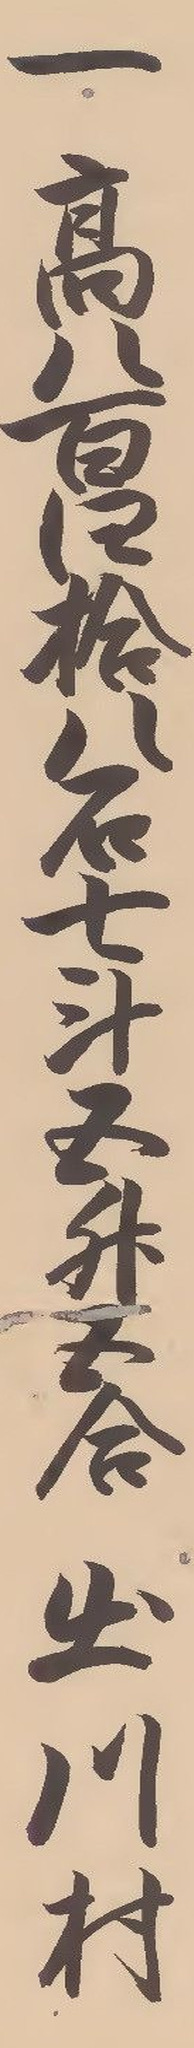一高八百四拾八石七斗五升五合出川村

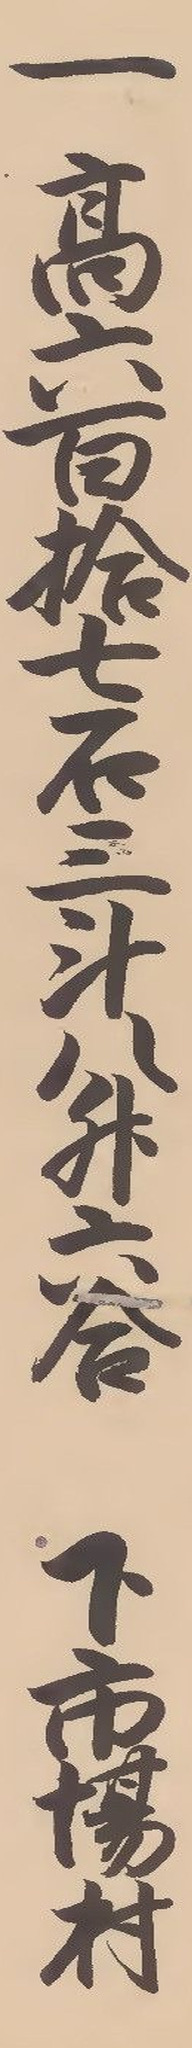一高六百拾七石三斗八升六合下市場村
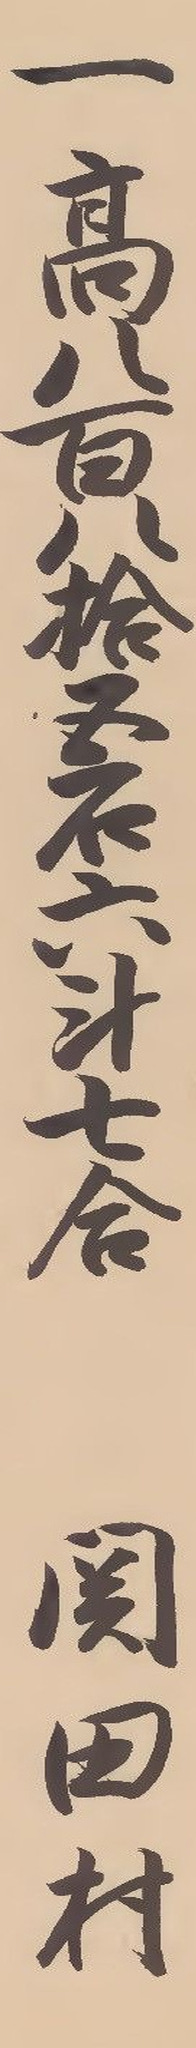一高八百八拾五石六斗七合関田村
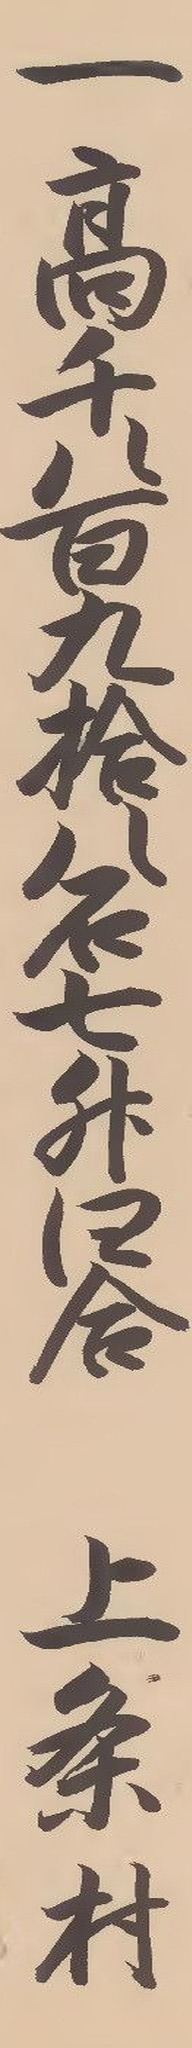一高千八百九拾八石七升四合上条村
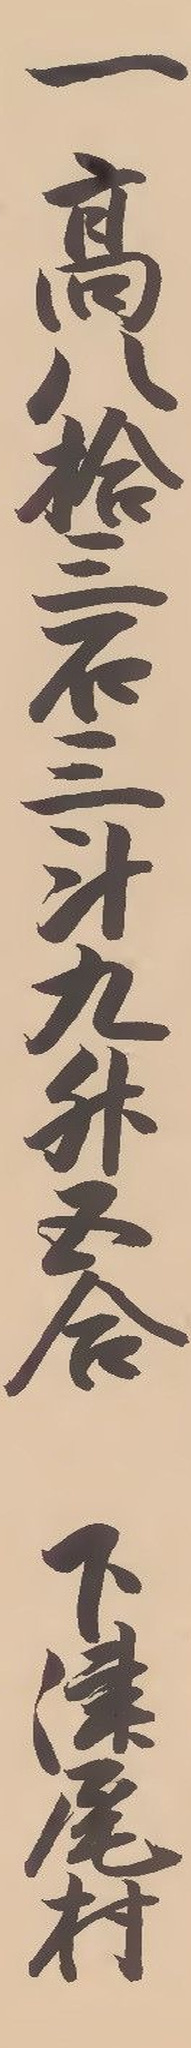一高八拾三石三斗九升五合下津尾村
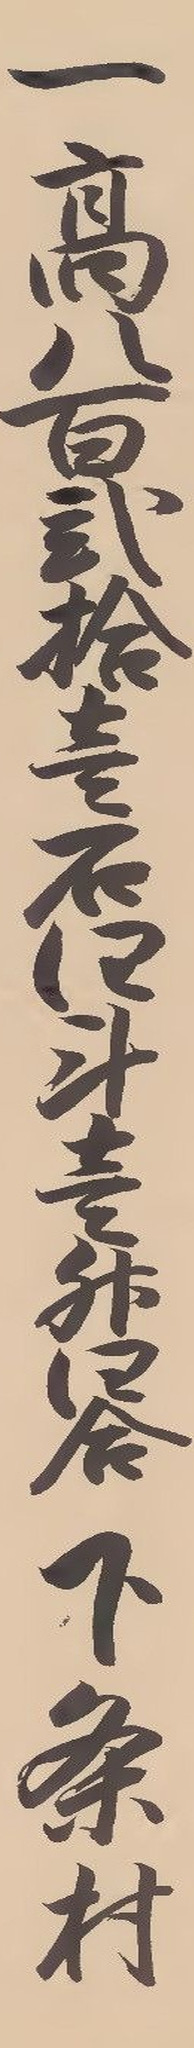一高八百弐拾壱石四斗壱升四合下条村
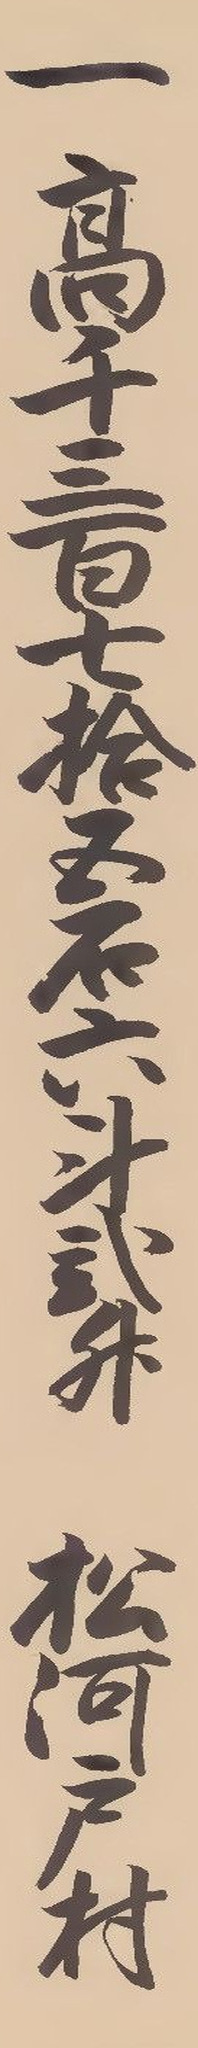一高千三百七拾五石六斗弐升松河戸村
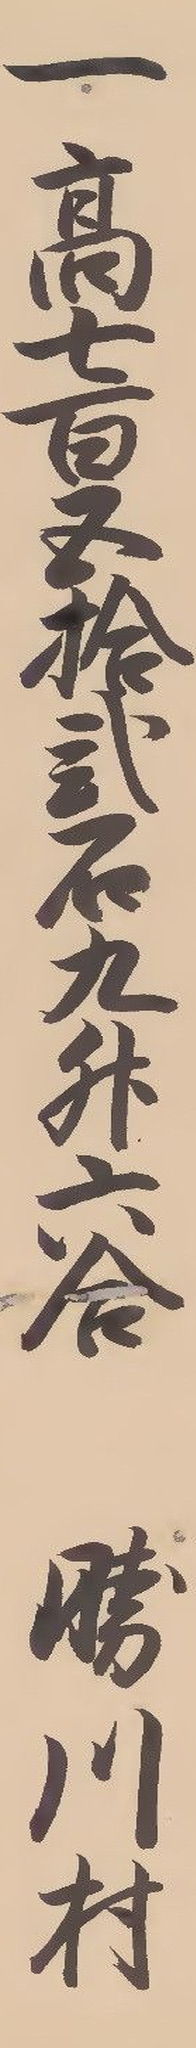一高七百五拾弐石九升六合勝川村

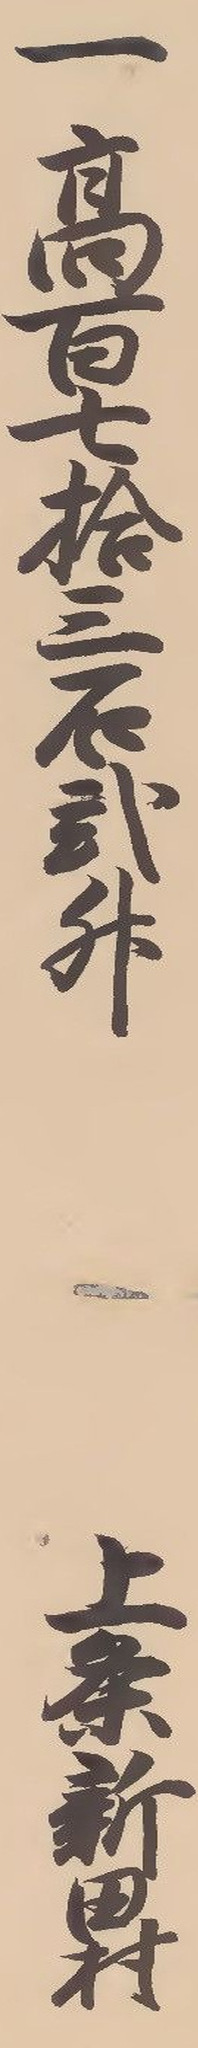一高百七拾三石弐升上条新田村
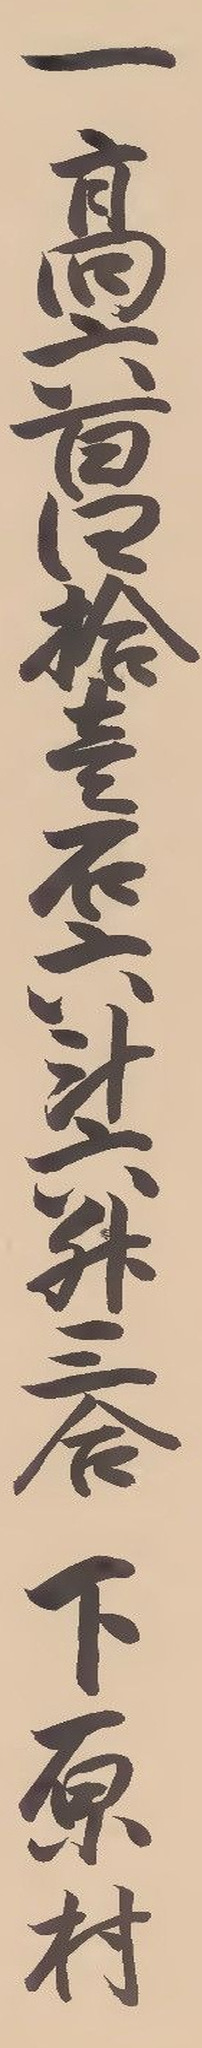一高六百四拾壱石六斗六升三合下原村
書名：尾張国郷帳
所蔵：国立公文書館 National Archives of Japan
